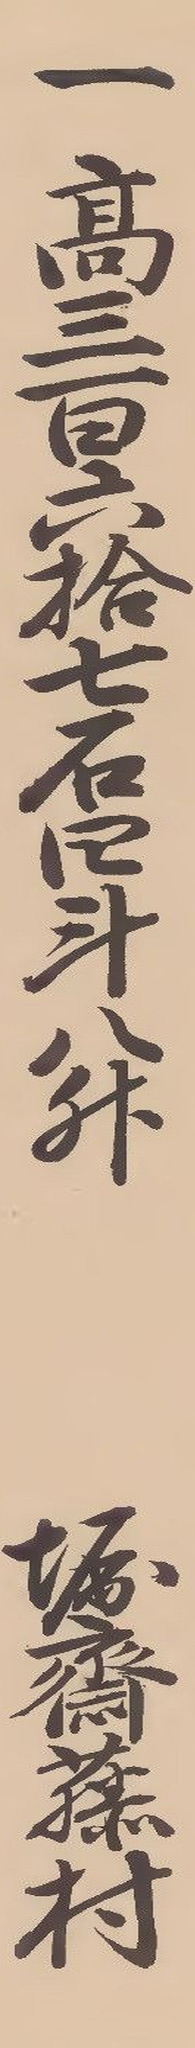一高三百六拾七石四斗八升堀斎藤村
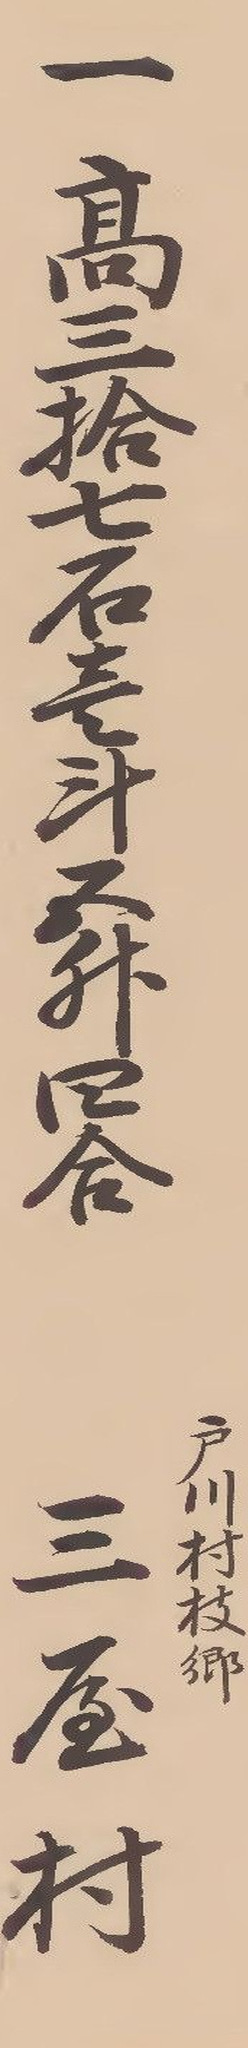一高三拾七石壱斗五升四合三屋村
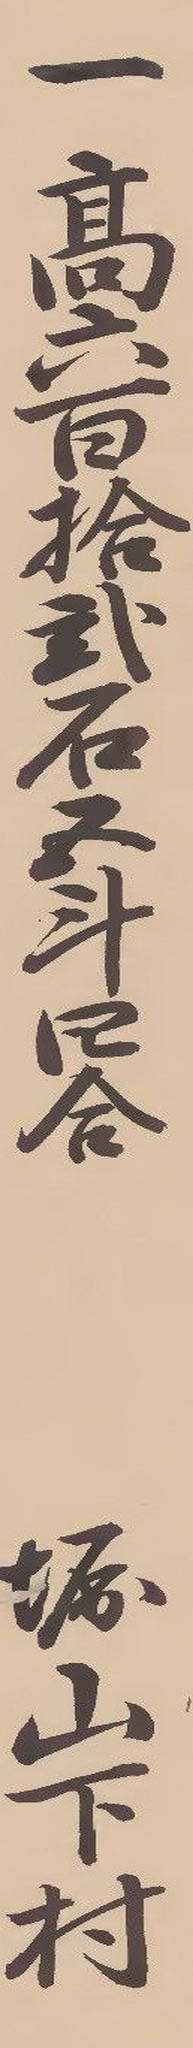一高六百拾弐石五斗四合堀山下村
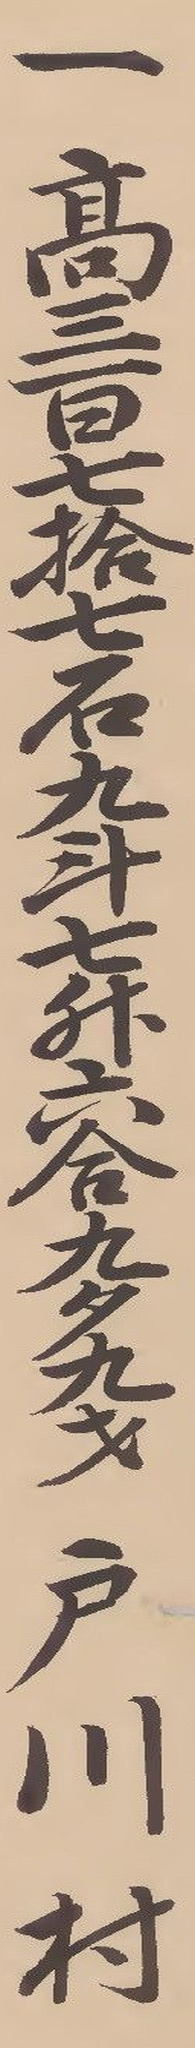一高三百七拾七石九斗七升六合九勺九才戸川村
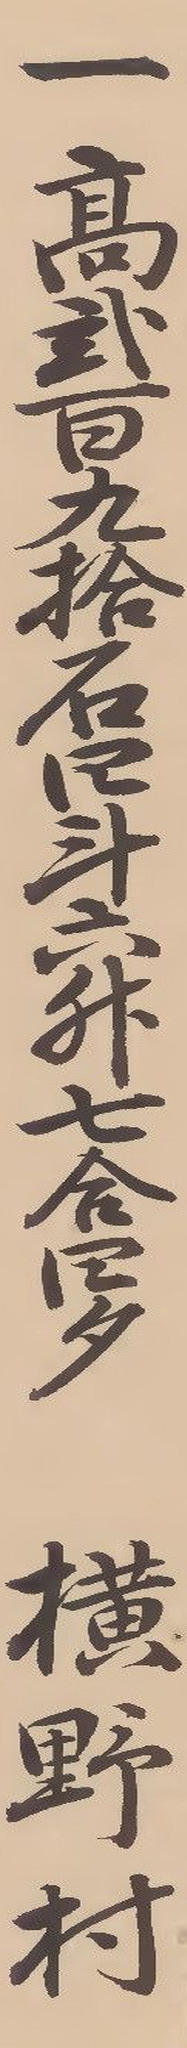一高弐百九拾石四斗六升七合四勺横野村
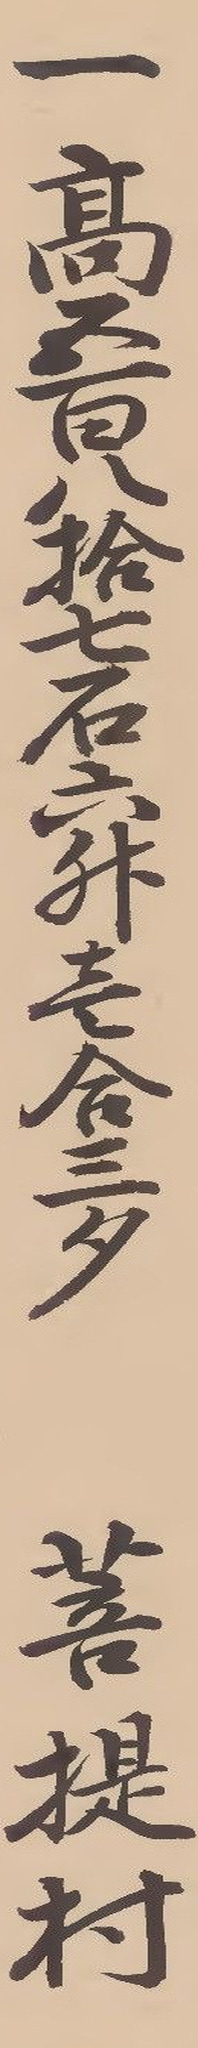一高五百八拾七石六升壱合三勺菩提村
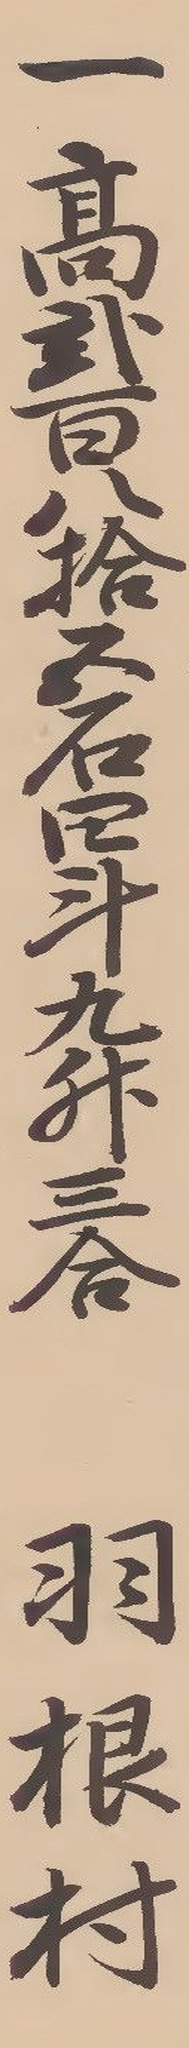一高弐百八拾五石四斗九升三合羽根村

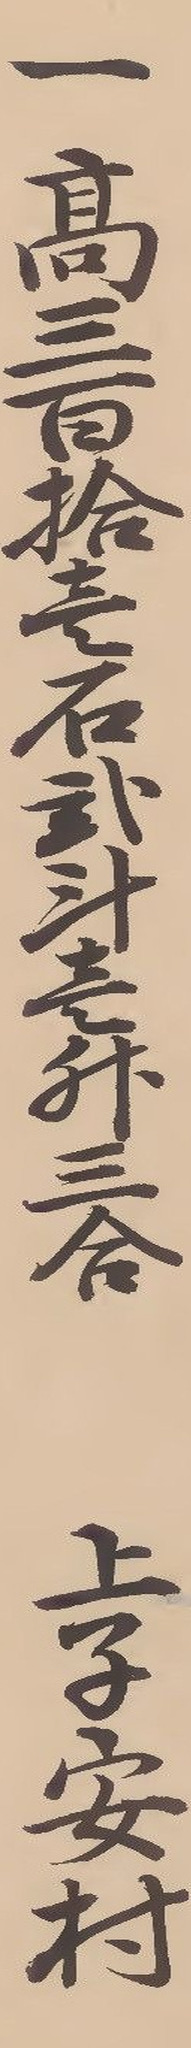一高三百拾壱石弐斗壱升三合上子安村
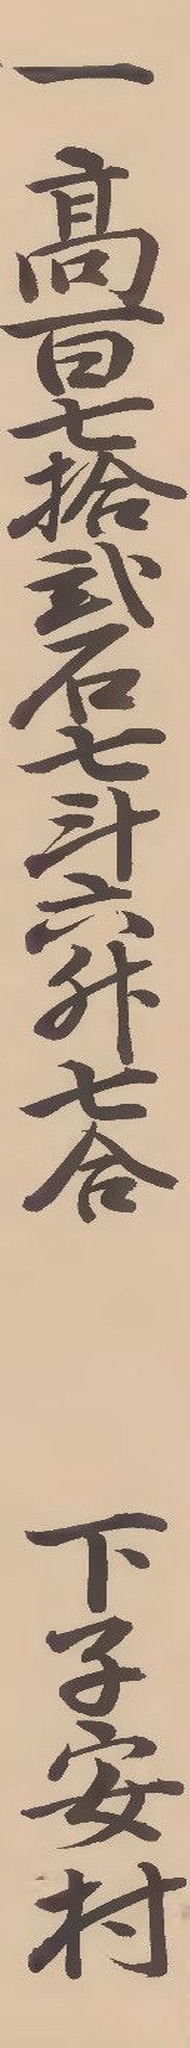一高百七拾弐石七斗六升七合下子安村
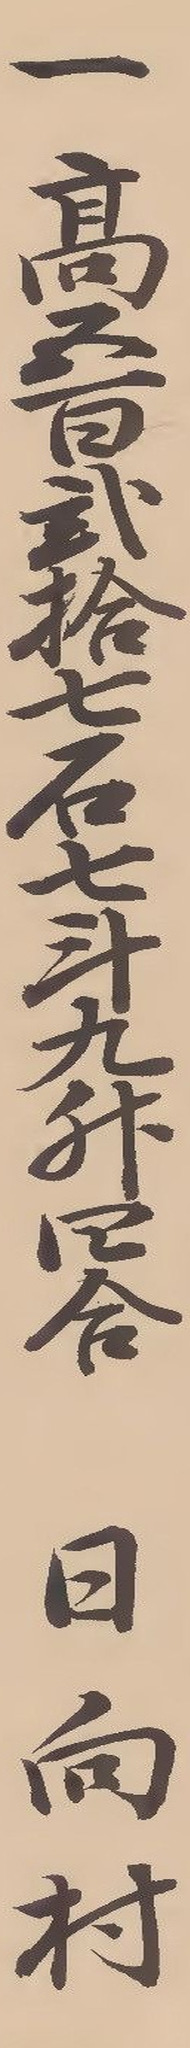一高五百弐拾七石七斗九升四合日向村
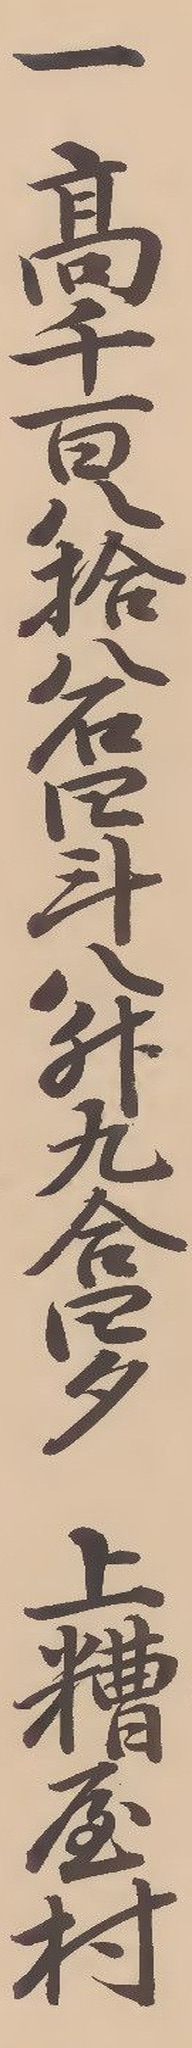一高千百八拾八石四斗八升九合四勺上糟屋村

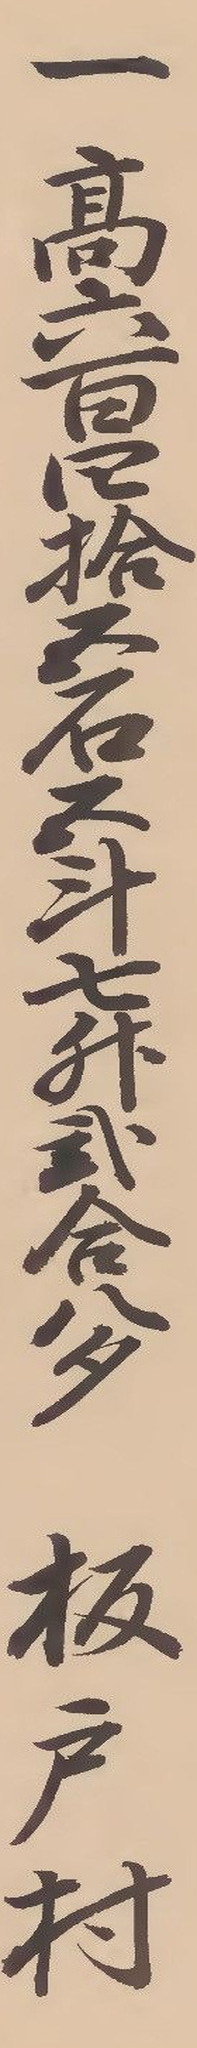一高六百四拾五石五斗七升弐合八勺板戸村
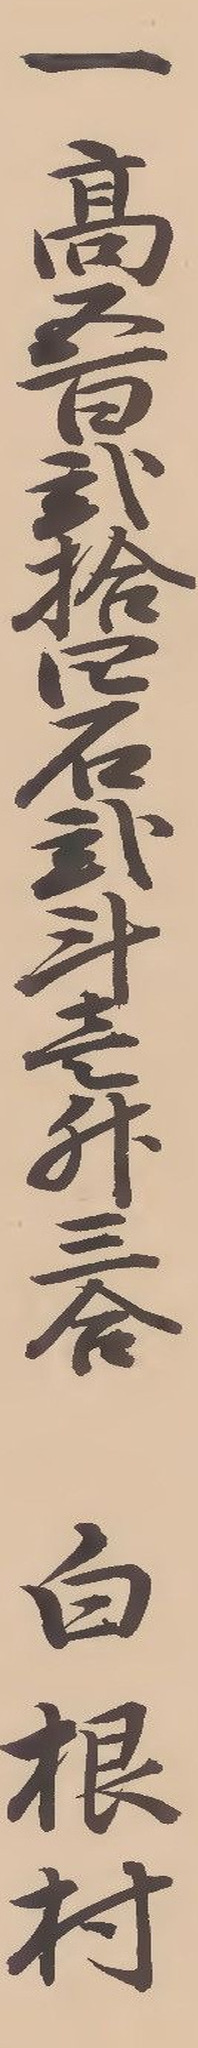一高五百弐拾四石弐斗壱升三合白根村
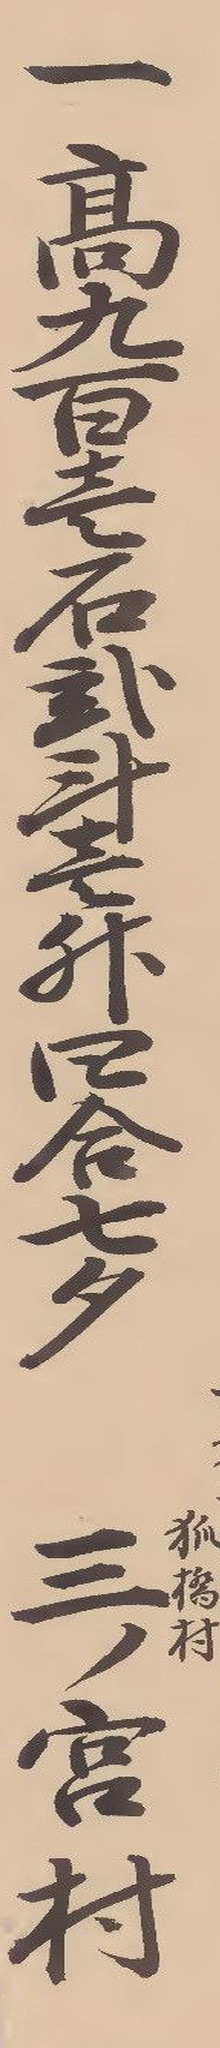一高九百壱石弐斗壱升四合七勺三ノ宮村
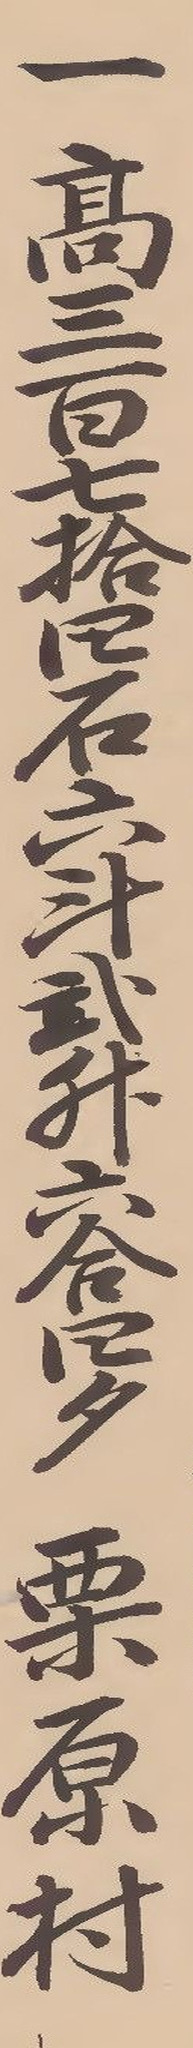一高三百七拾四石六斗弐升六合四勺栗原村
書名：相模国郷帳
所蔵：国立公文書館 National Archives of Japan
